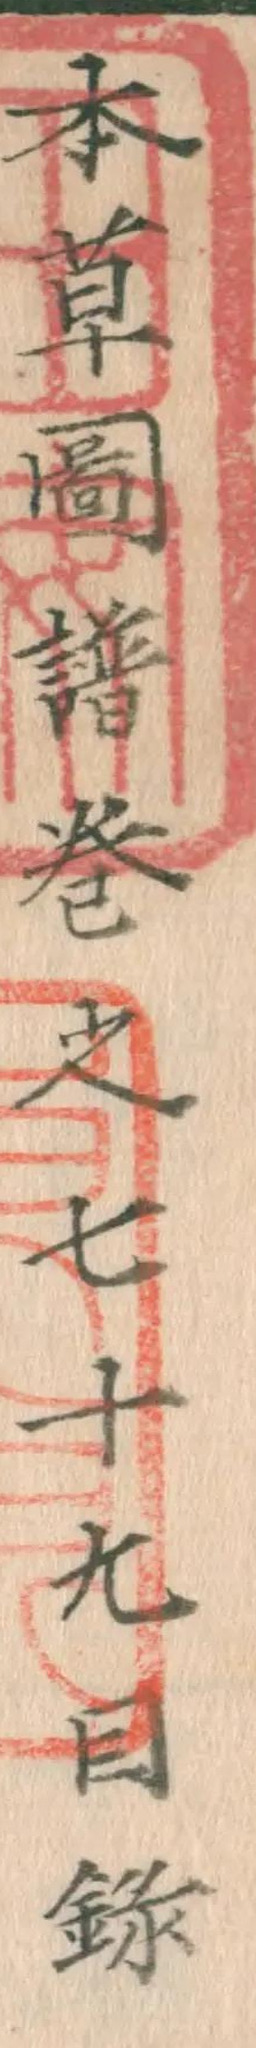本草図譜巻之七十九目録
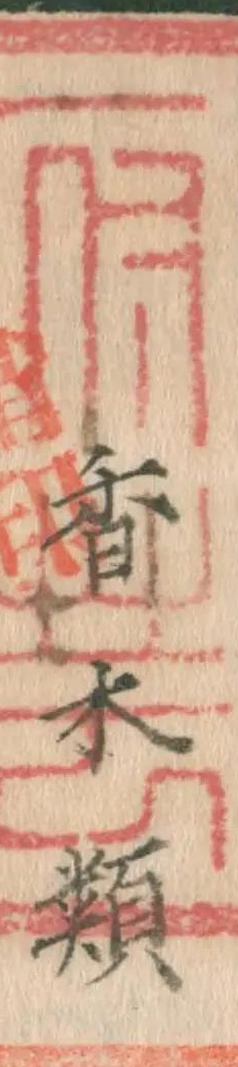香木類
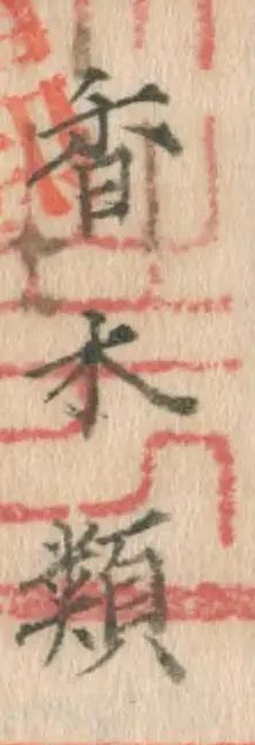香木類
